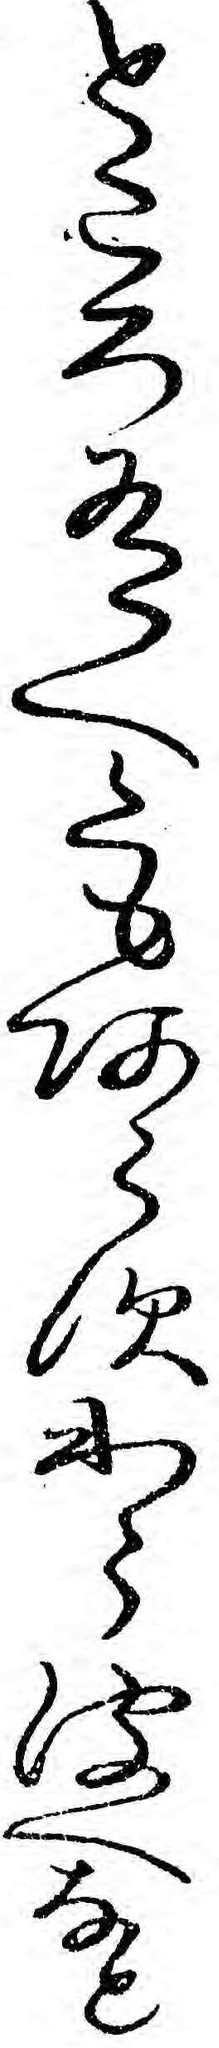ところ有へくもあらすわらはへなと
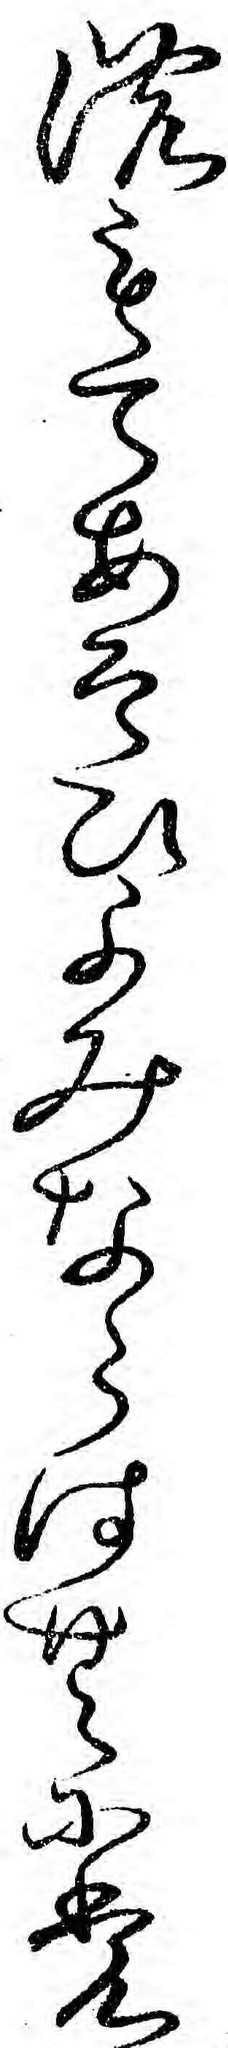のもてあそひよみならはむにも
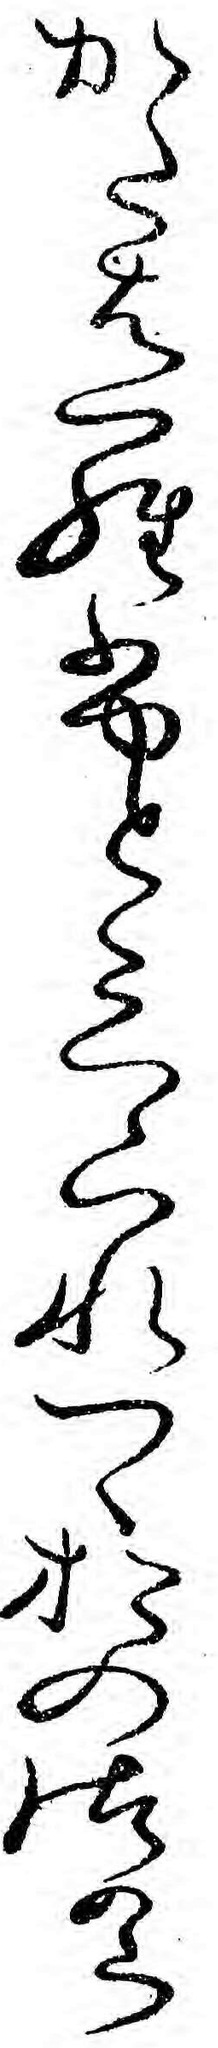かたはらふとみられつゝおのつから
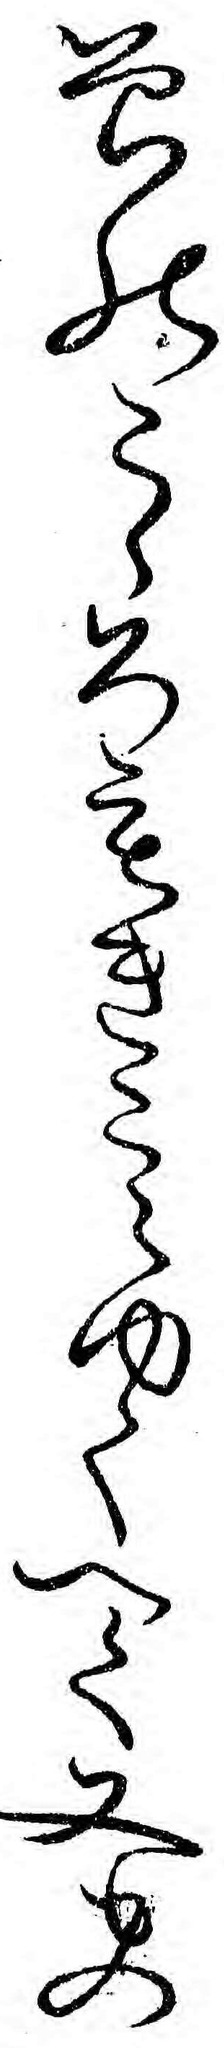そのこゝろもきこえゆくへく又もの
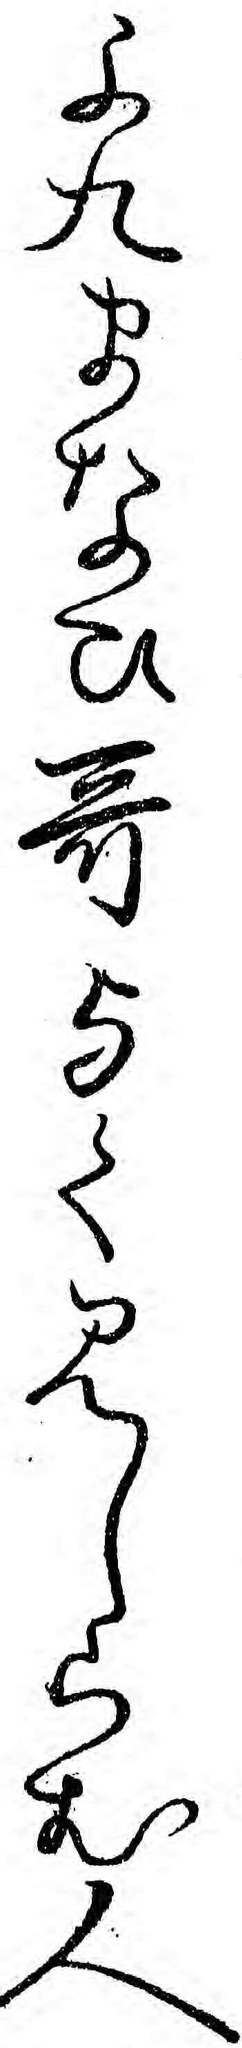よくまなひ哥よく見しらむ人
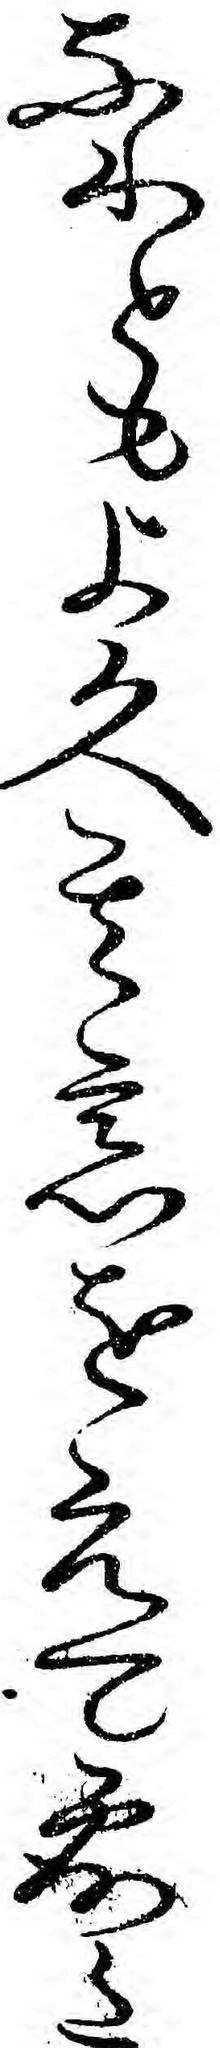なりともよく其意をえて露た
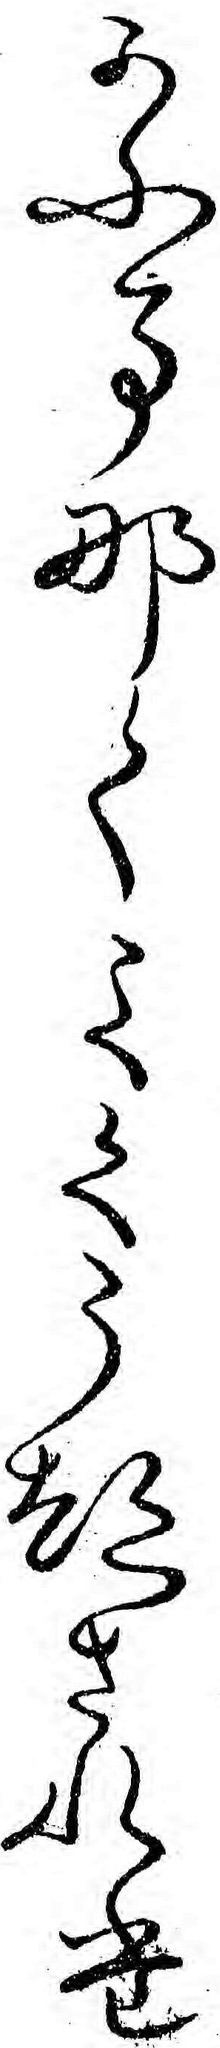かふ事なくよくうつされた
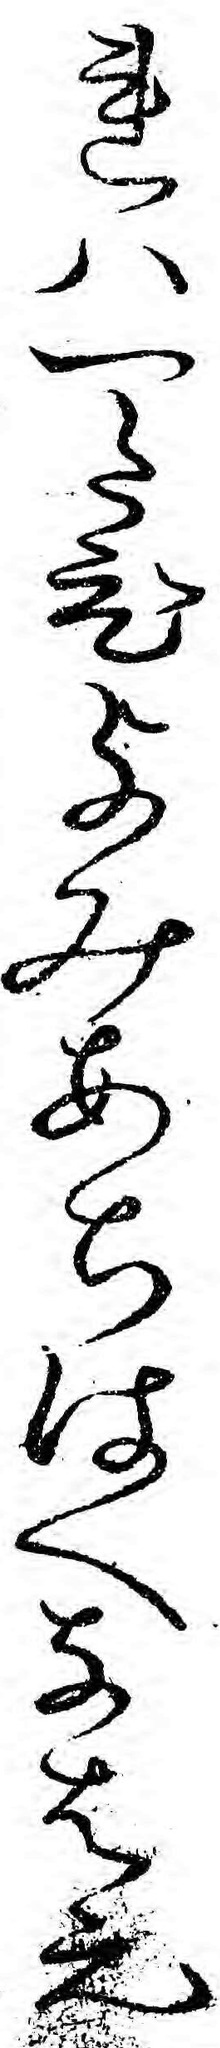れは一たひよみあちはへなはえ

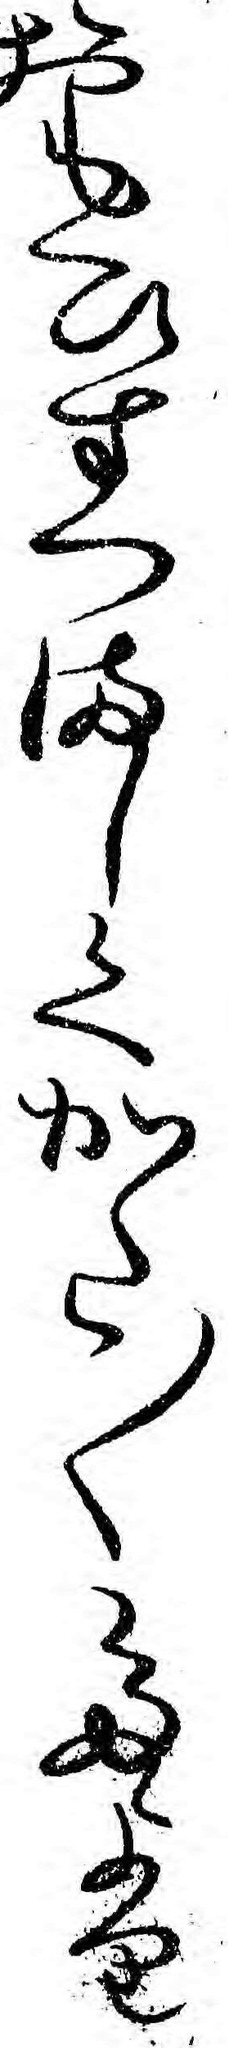おもひすつましくかた〳〵たより
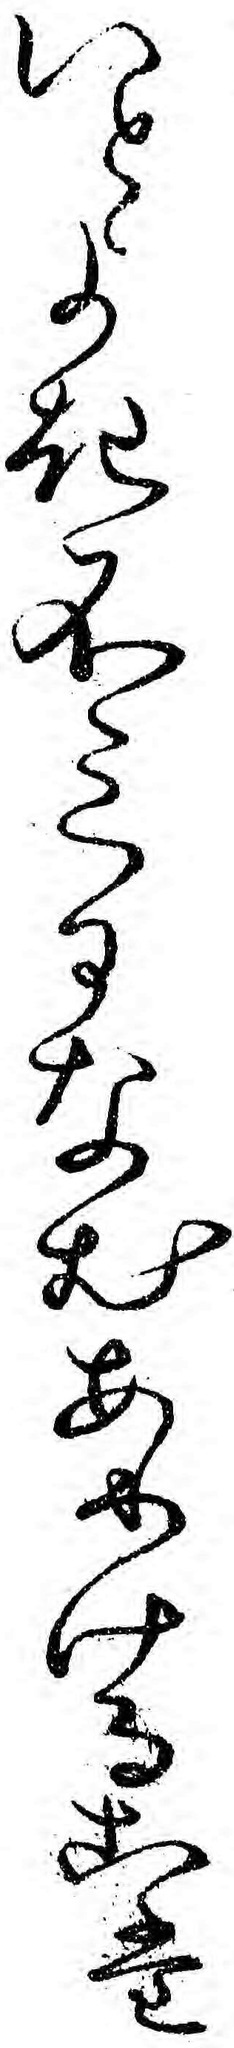いとよきふみになむありけるこた
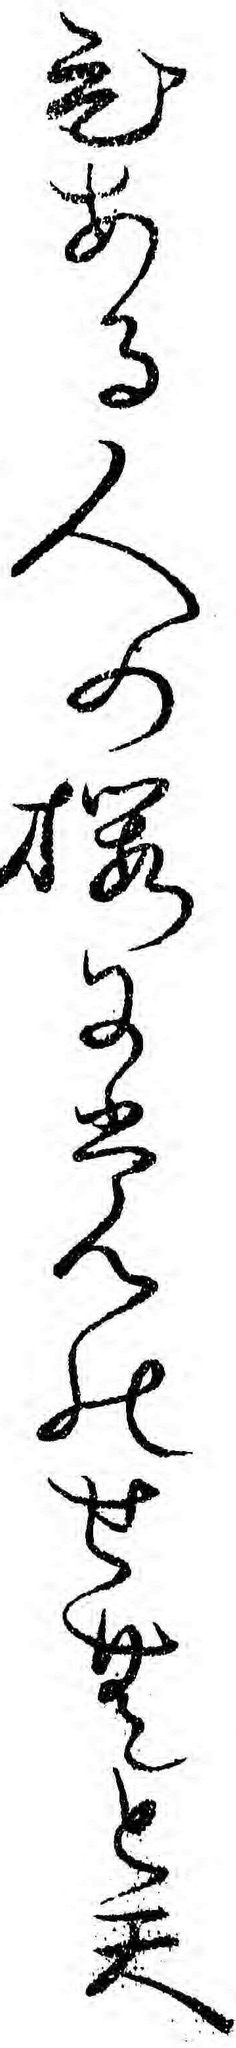ひある人の桜に覚のせむとて
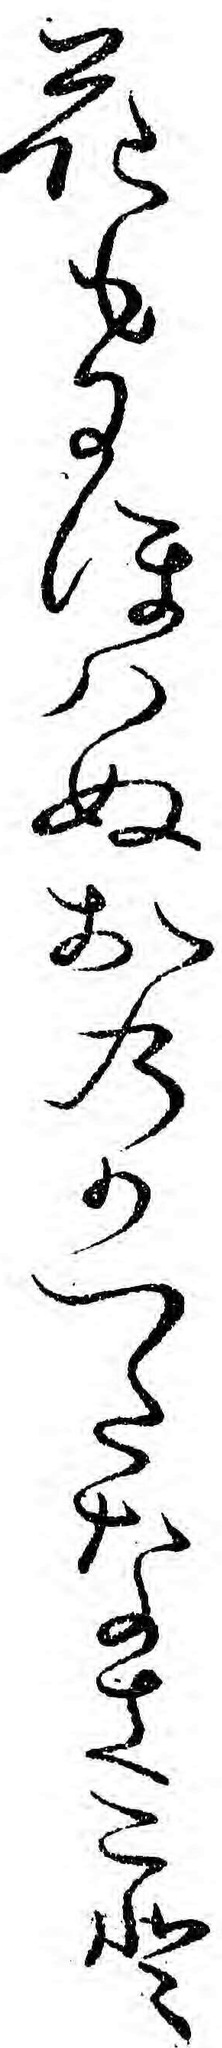花もにほはぬおのかつたなきこと
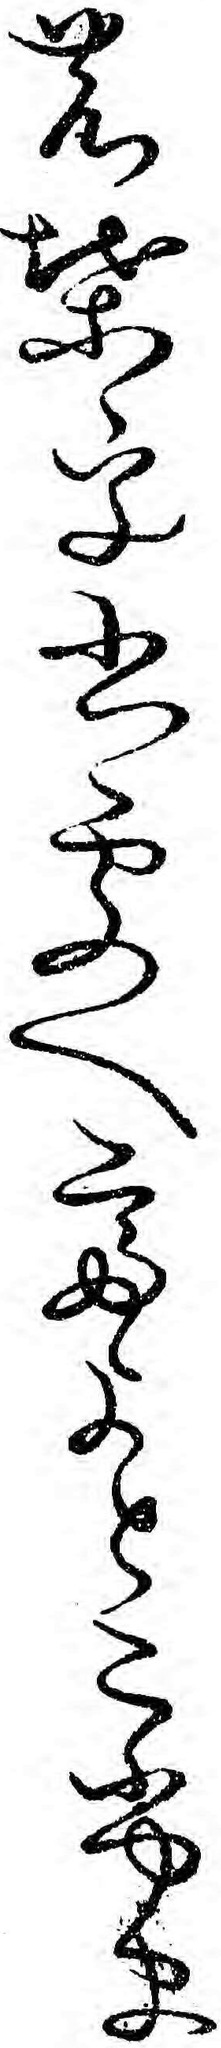のはを書そへてよとこふま
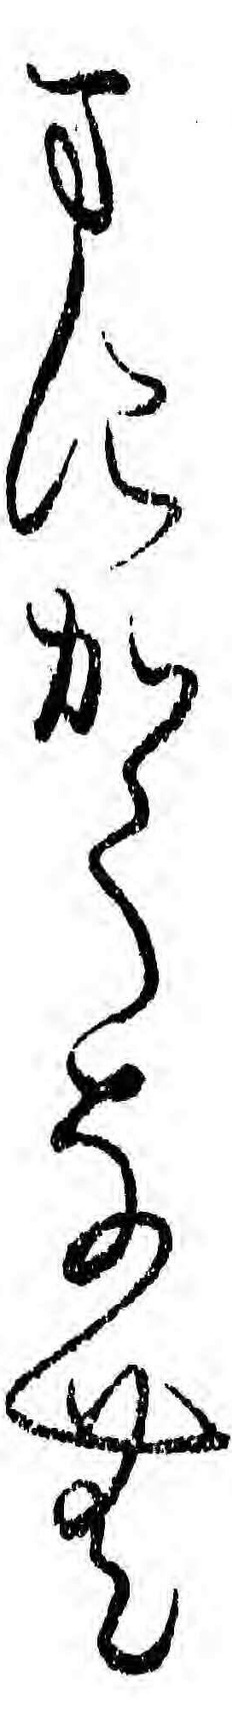まにかくなむ
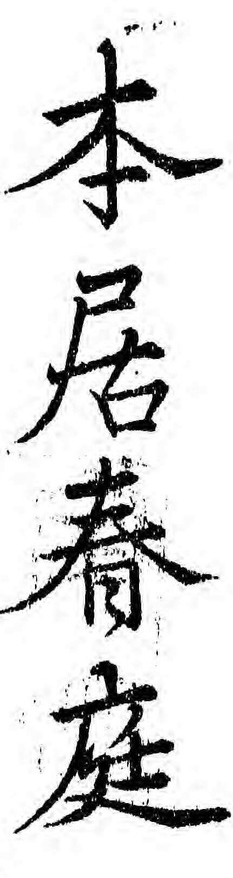本居春庭
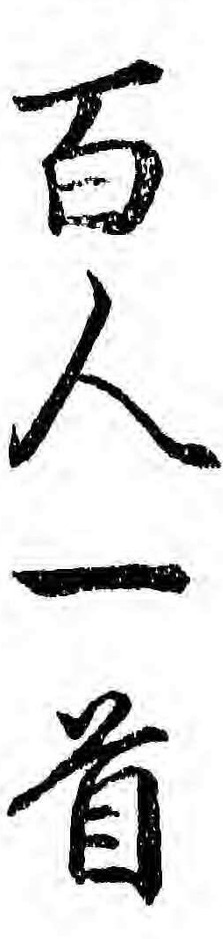百人一首
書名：百人一首／小倉の山ふみ
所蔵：国文学研究資料館
